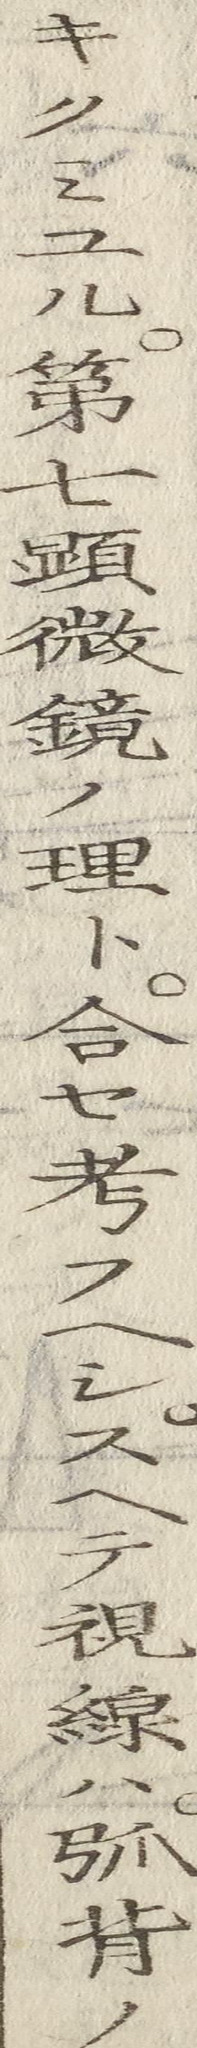キクミユル。第七顕微鏡ノ理ト。合セ考フヘシ。スヘテ視線ハ。弧背ノ
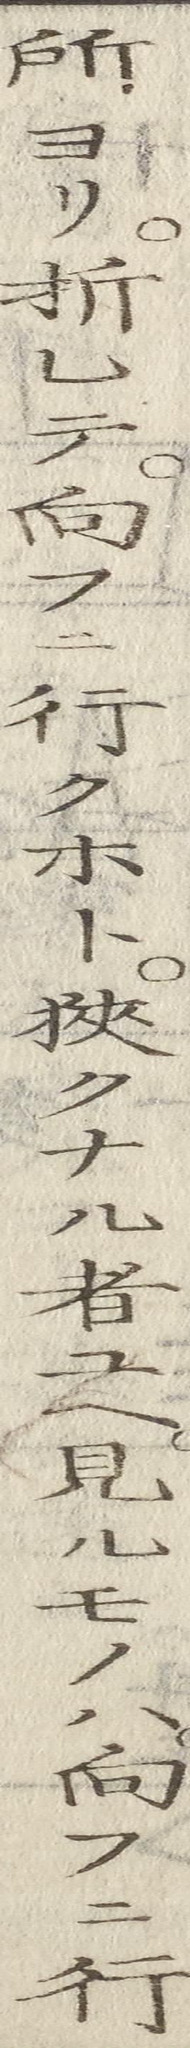所ヨリ。折レテ。向フニ行クホト。狭クナル者ユヘ。見ルモノハ。向フニ行
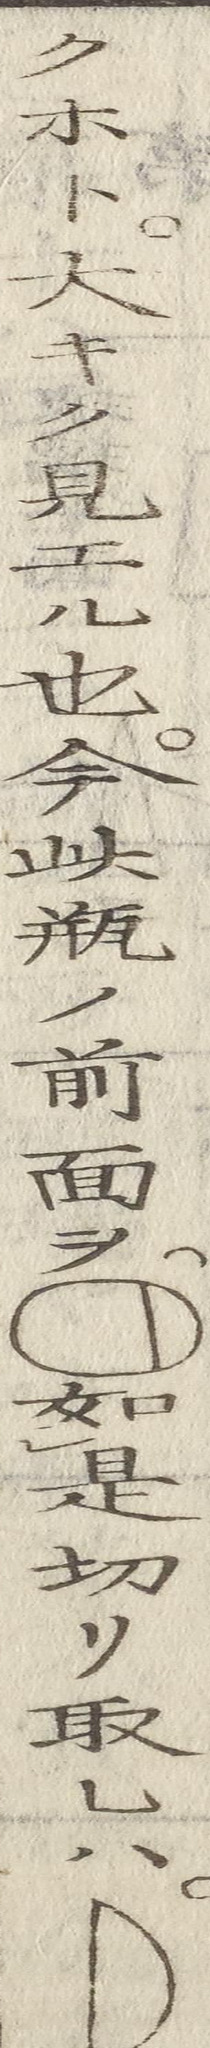クホト。大キク見エル也。今此瓶ノ全面ヲ。如是切リ取レハ。
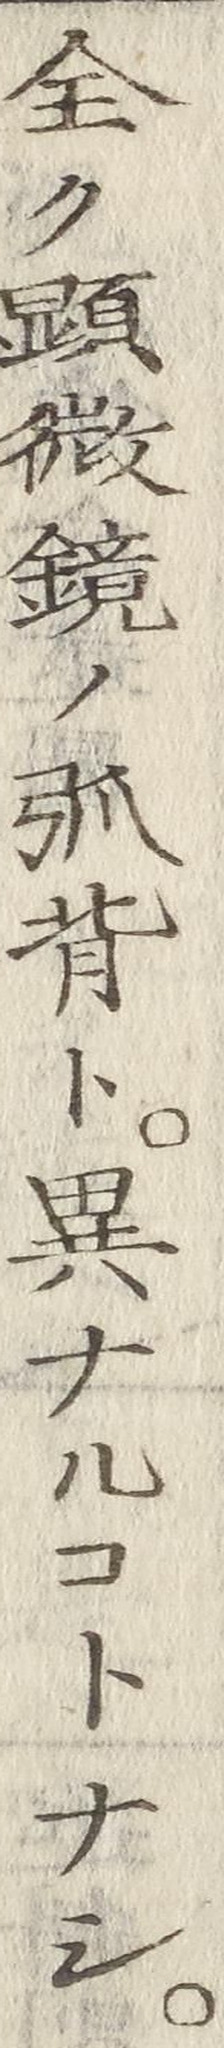全ク顕微鏡ノ弧背ト。異ナルコトナシ。
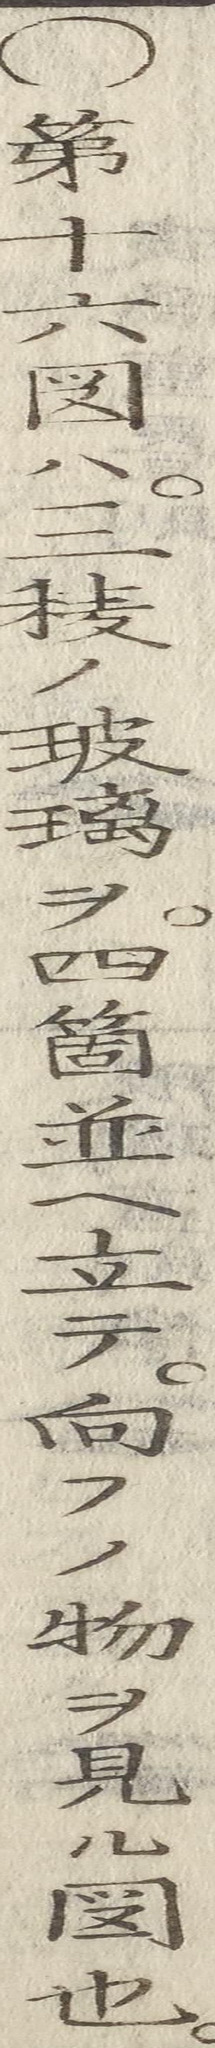○第十六図ハ。三稜ノ玻璃ヲ。四箇並ヘ立テ。向フノ物ヲ見ル図也。

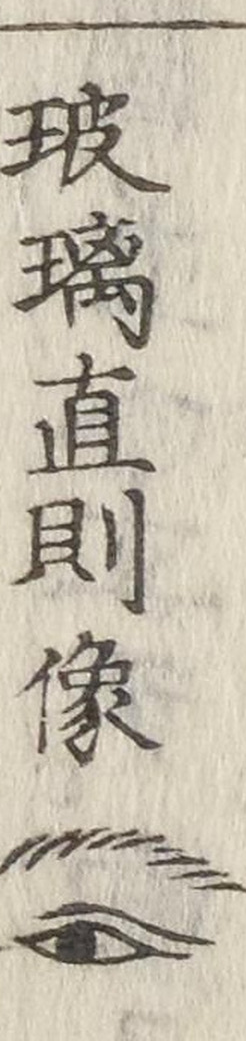玻璃直則像
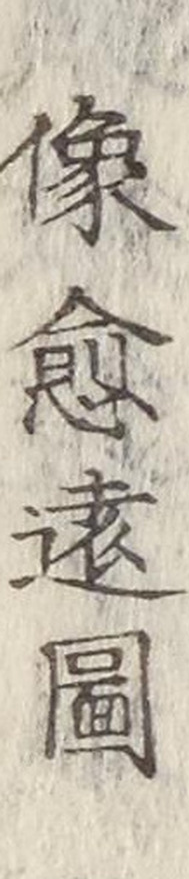像愈遠図
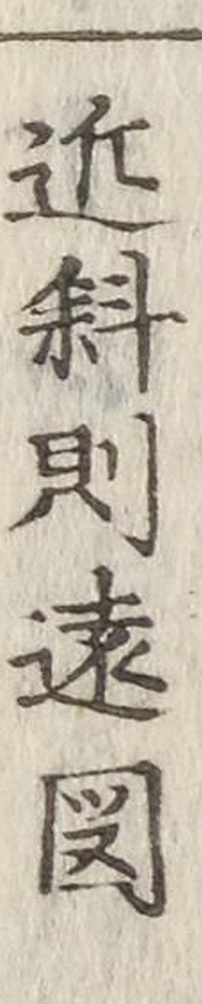近斜則遠図
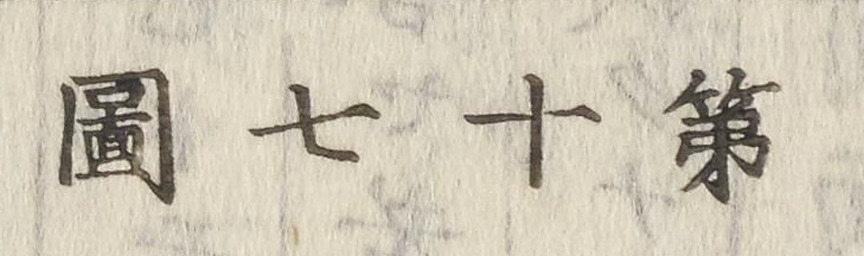第十七図
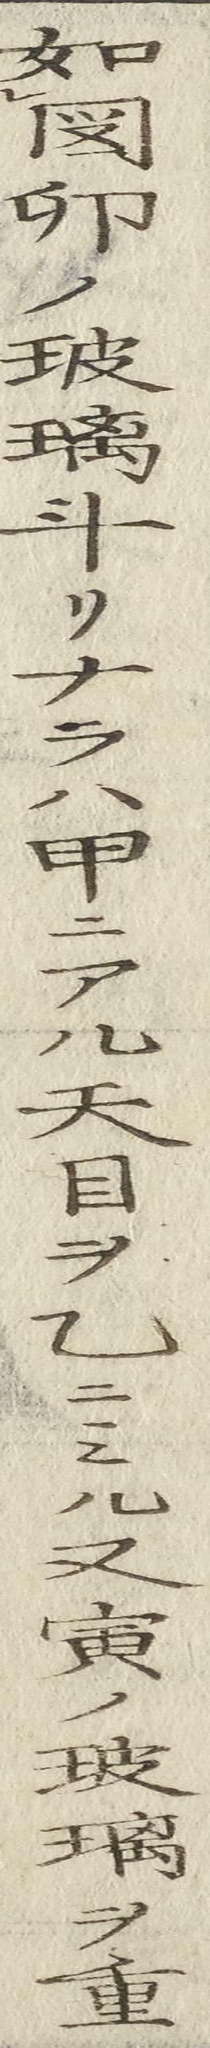如図卯ノ玻璃斗リナラハ甲ニアル天目ヲ乙ニミル又寅ノ玻璃ヲ重
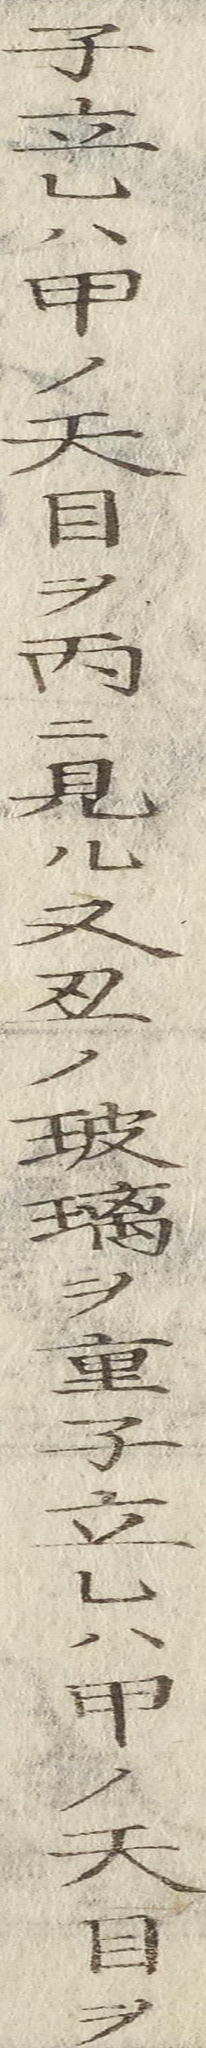ネ立レハ甲ノ天目ヲ丙ニ見ル又丑ノ玻璃ヲ重ネ立レハ甲ノ天目ヲ
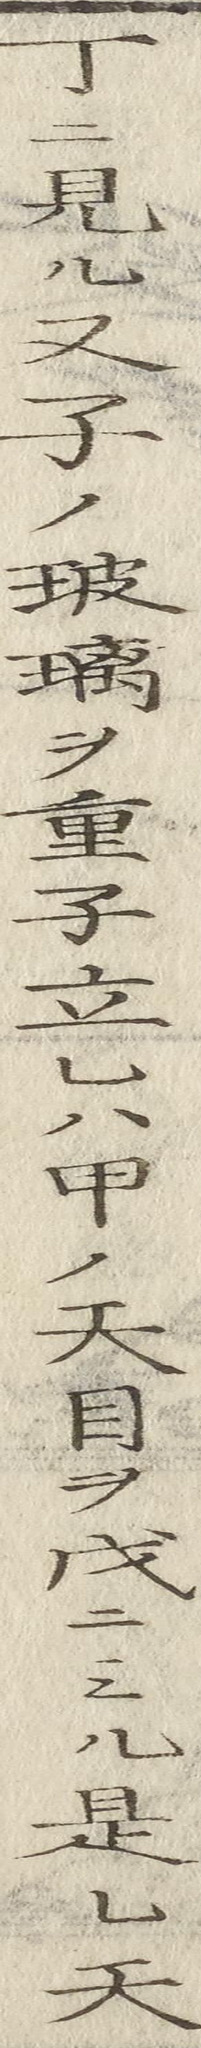丁ニ見ル又子ノ玻璃ヲ重ネ立レハ甲ノ天目ヲ戊ニミル是レ天
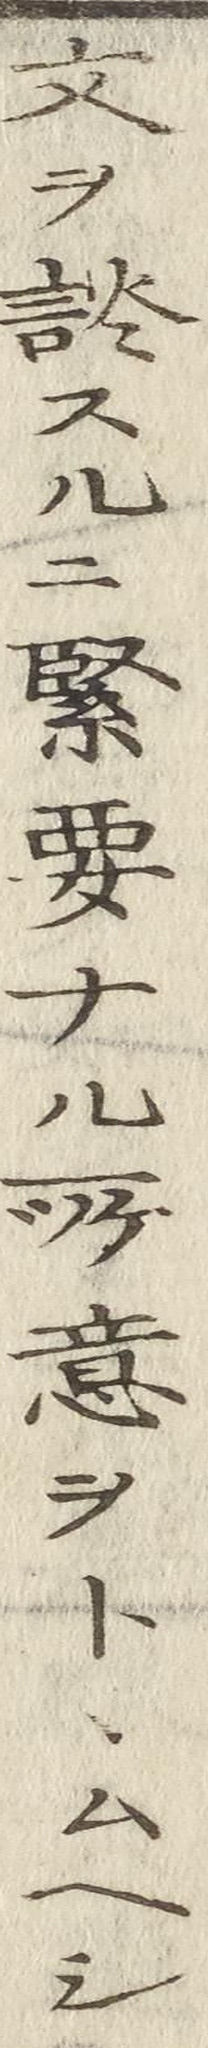文ヲ談スルニ緊要ナル所意ヲトヽムヘシ
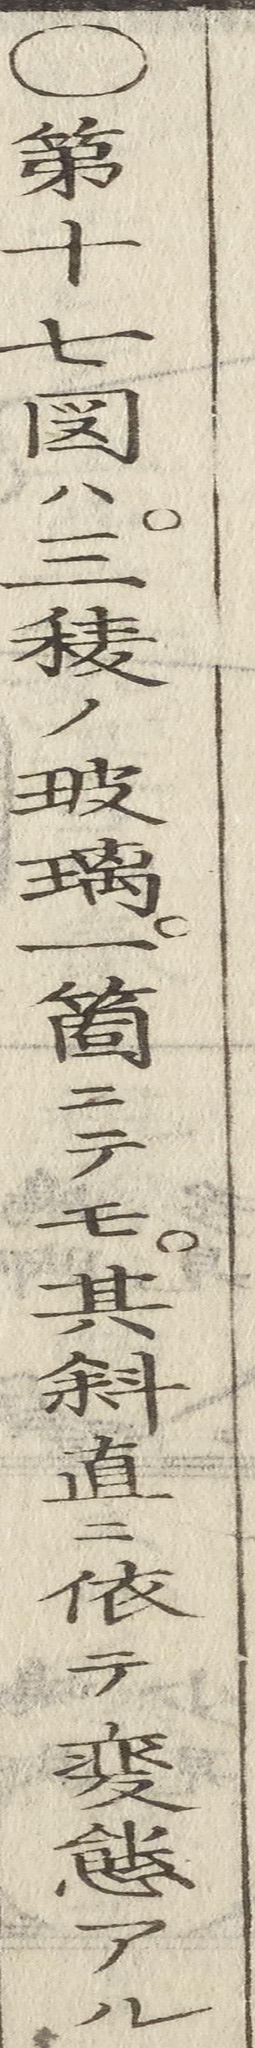○第十七図ハ。三稜ノ玻璃。一箇ニテモ。其斜直ニ依テ変態アル
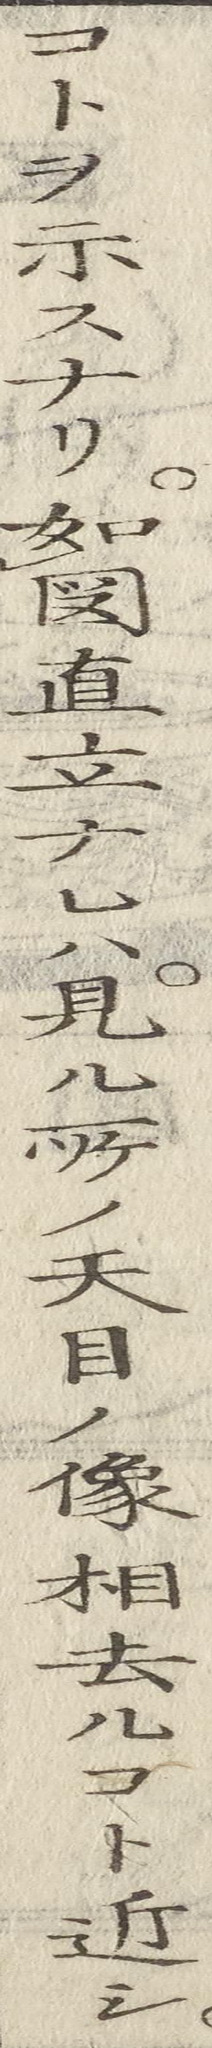コトヲ示スナリ。如図直立ナレハ。見ル所ノ天目ノ像相去ルコト近シ。
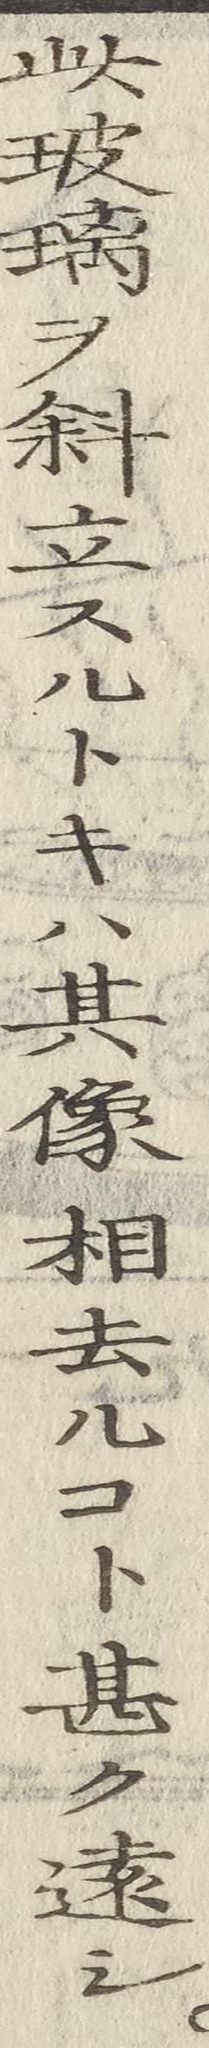此玻璃ヲ斜立スルトキハ其像相去ルコト甚ク遠シ。
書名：護法新論　上
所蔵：東京大学地震研究所図書室 Earthquake Research Institute Library, The University of Tokyo, JAPAN
